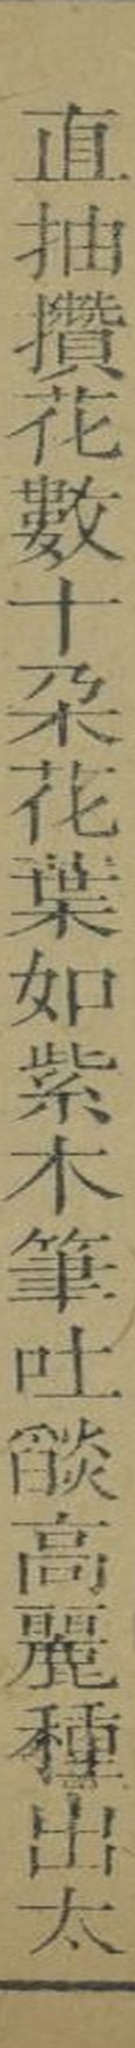直抽攢花数十朶花葉如柴木筆吐燄高麗種出太
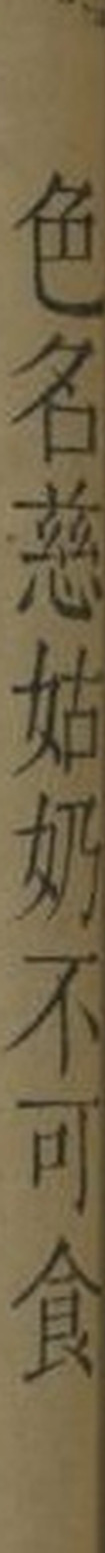色名慈姑奶不可食
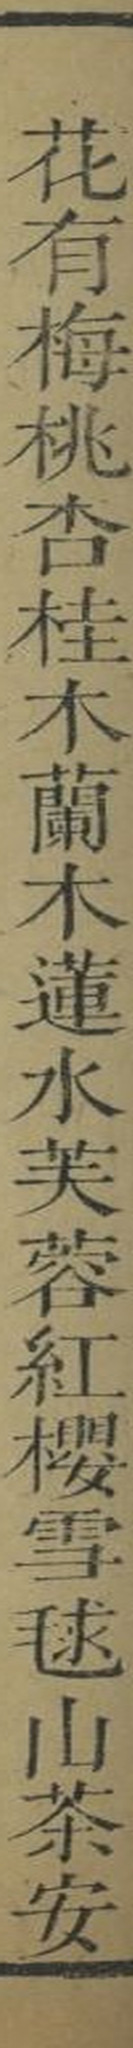花有梅桃杏桂木蘭木蓮水芙蓉紅桜雪毬山茶安
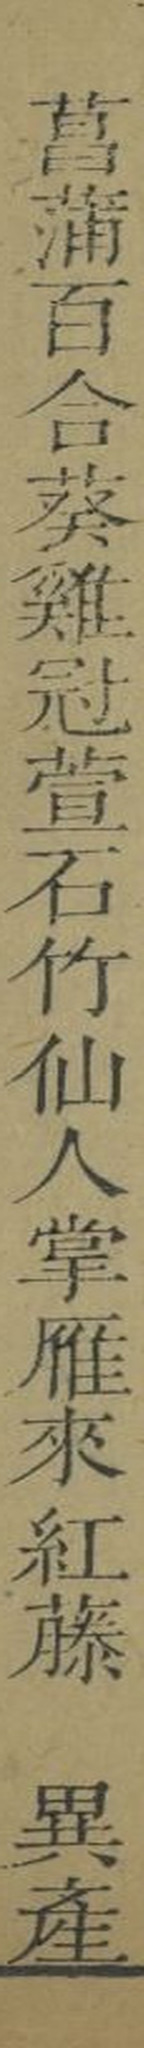菖蒲百合葵鶏冠萱石竹仙人掌雁来紅藤異産
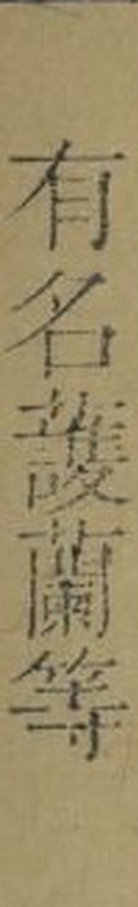有名護蘭等

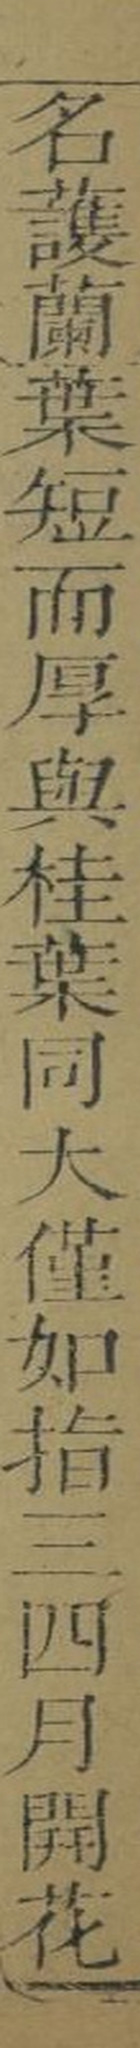[名護蘭]葉短而厚与桂葉同大僅如指三四月開花
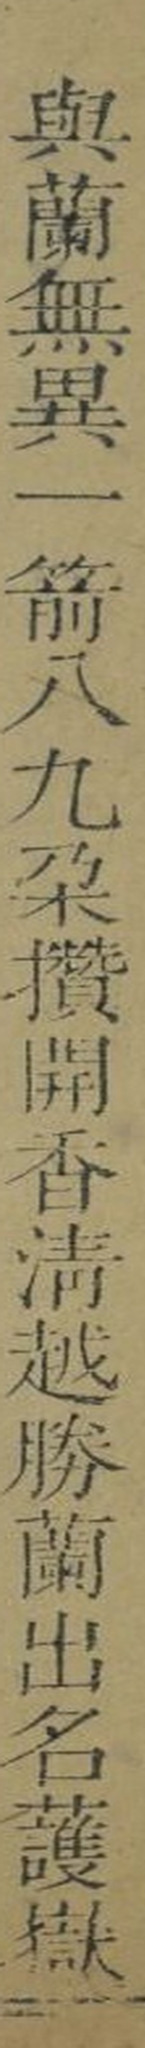与蘭無異一箭八九朶攢開香清越勝蘭出名護岳
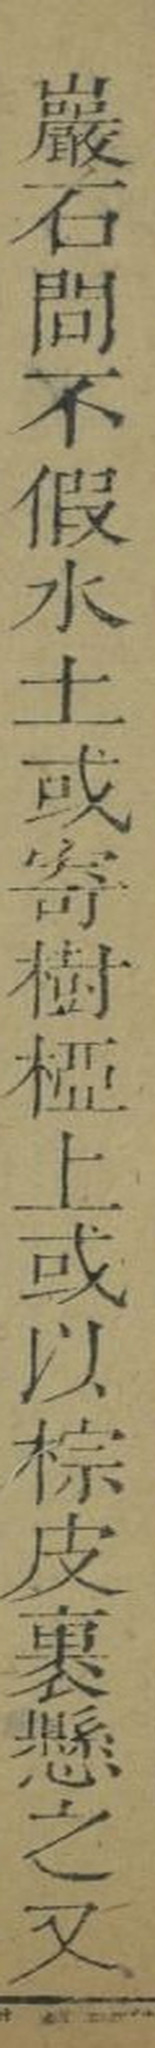巌石間不假水土或寄樹椏上或以棕皮裹懸之又
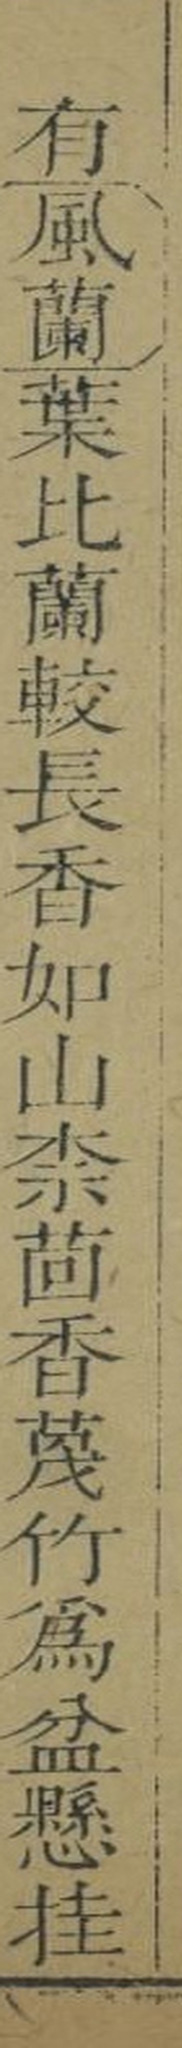有[風蘭]葉比蘭較長香如山奈茴香蔑竹為盆懸挂
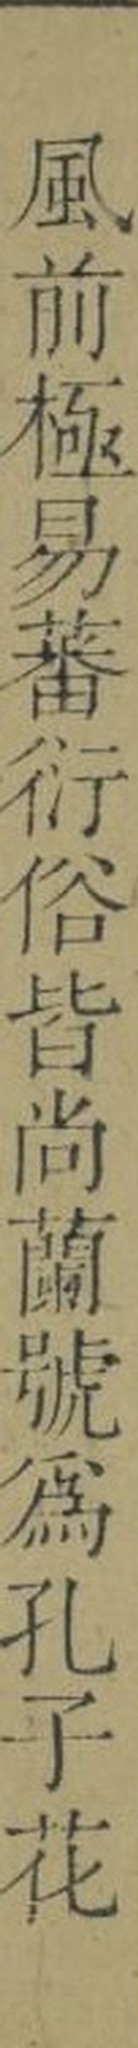風前極易蕃衍俗皆尚蘭号為孔子花
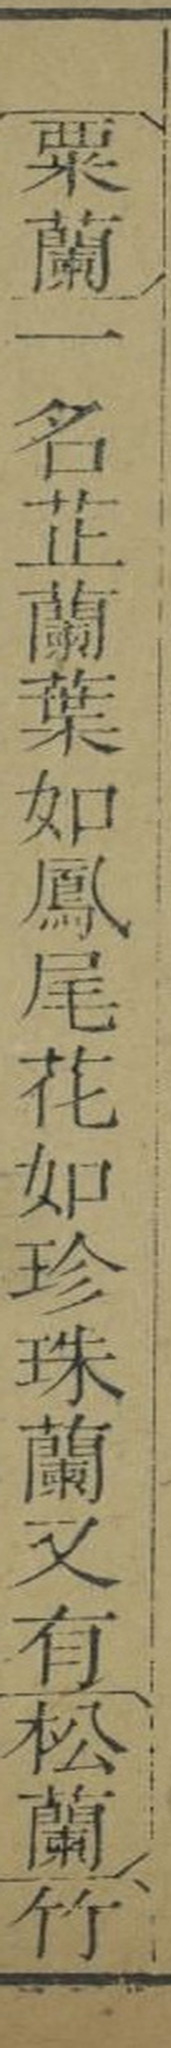[粟蘭]一名芷蘭葉如鳳尾花如珍珠蘭又有[松蘭][竹
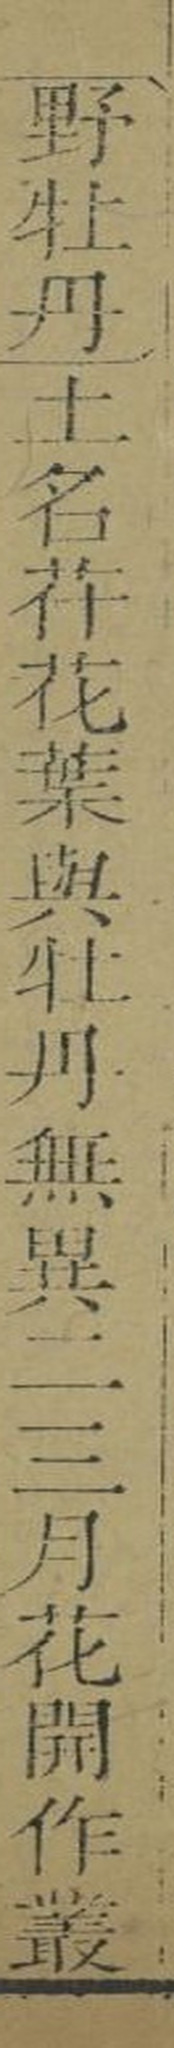[野牡丹]土名𦬯花葉与牡丹無異二三月花開作叢
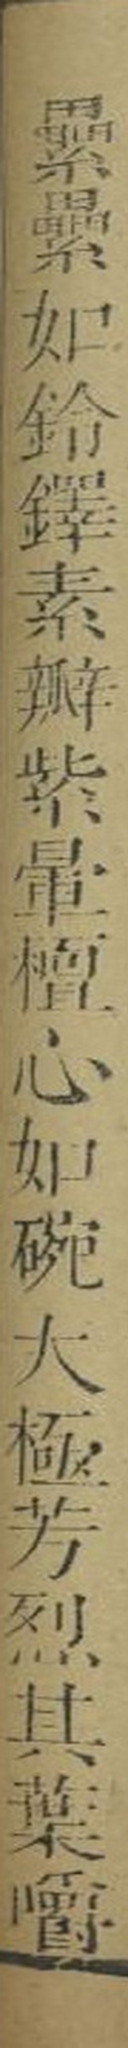纍纍如鈴鐸素弁紫暈檀心如碗大極芳烈其葉嚼
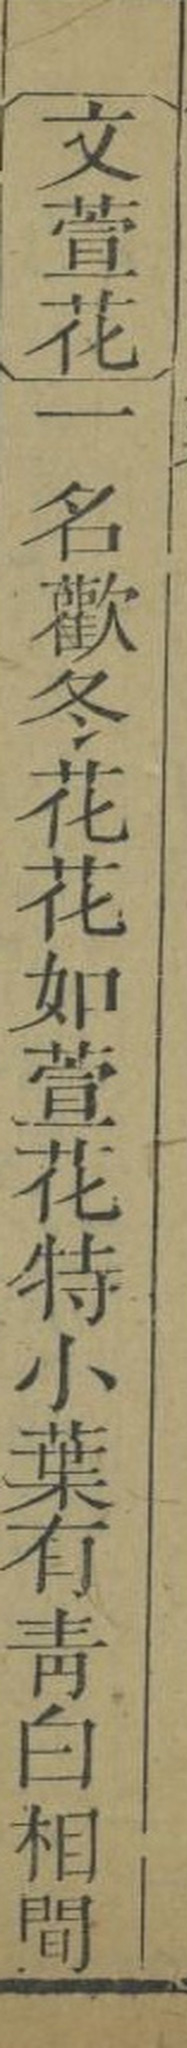[文萱花]一名歓冬花花如萱花特小葉有青白相間
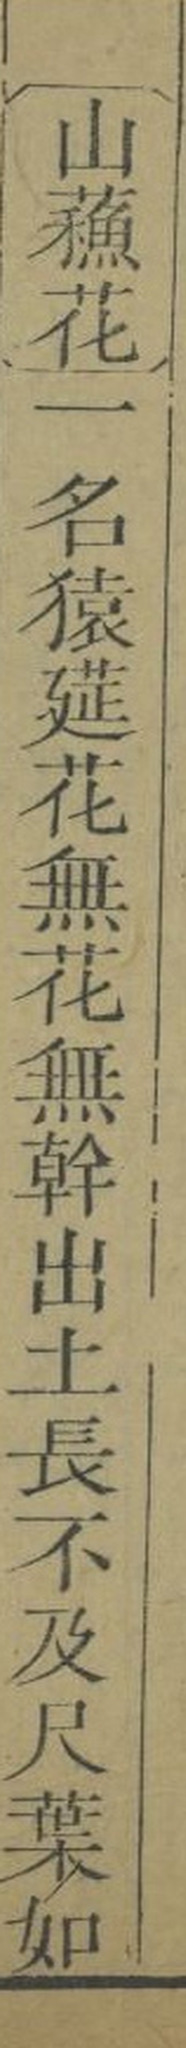[山蘓花]一名猿莚花無花無幹出土長不及尺葉如
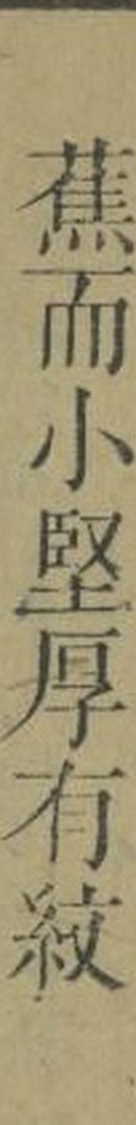蕉而小堅厚有紋
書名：中山伝信録 巻六
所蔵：University of the Ryukyus Library
